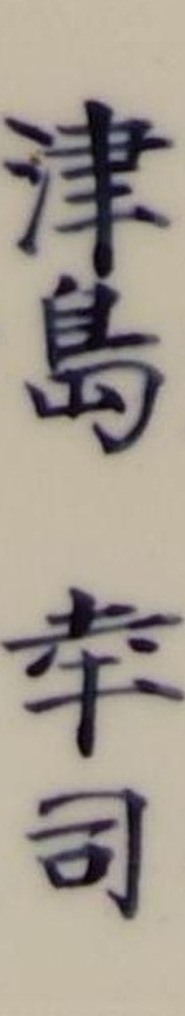津島幸司
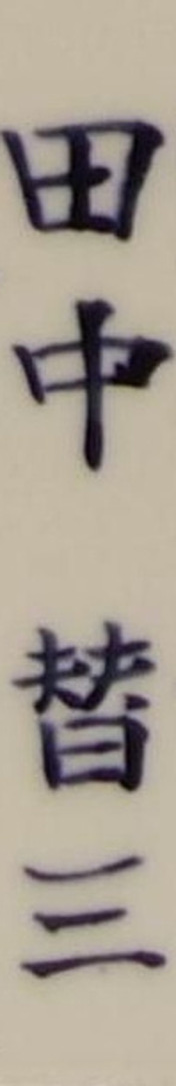田中替三
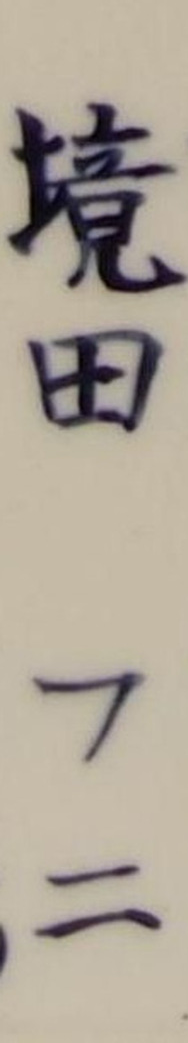境田フ二

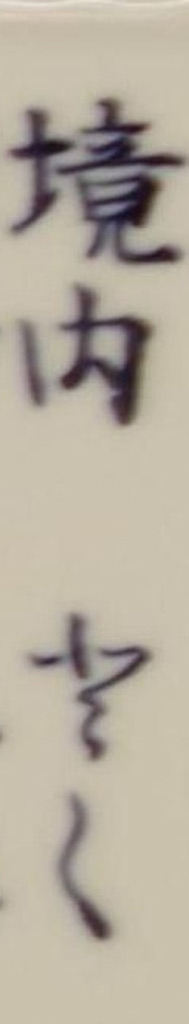境内とく
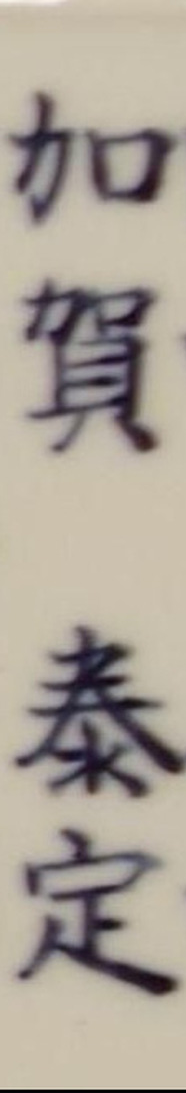加賀秦定
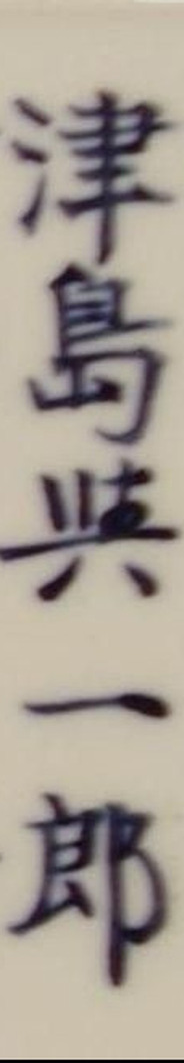津島与一郎
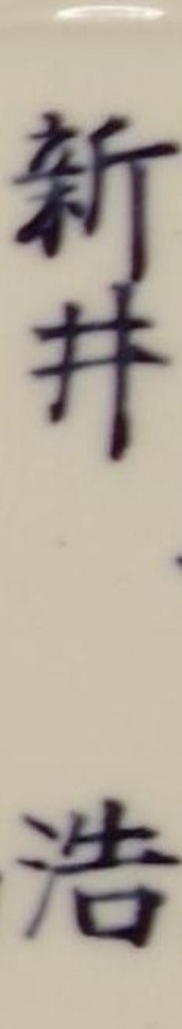新井浩
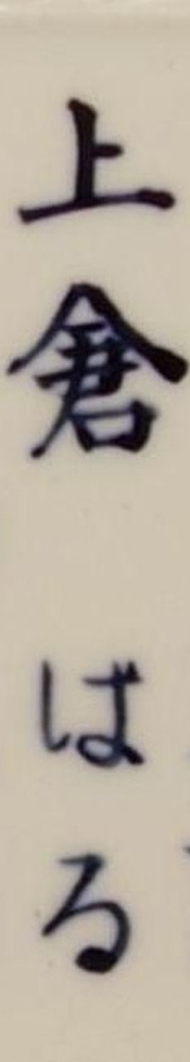上倉はる
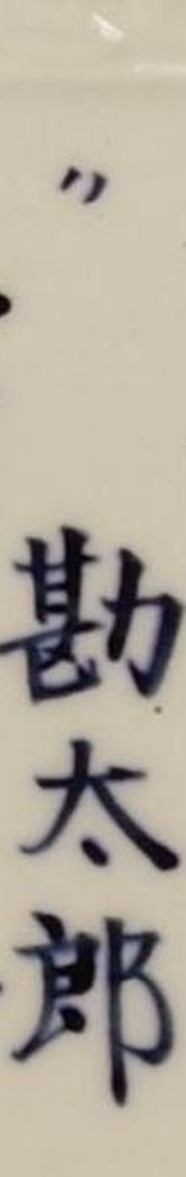勘太郎
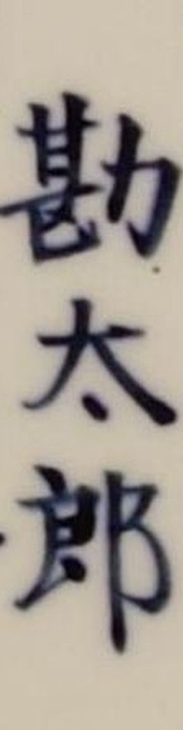勘太郎
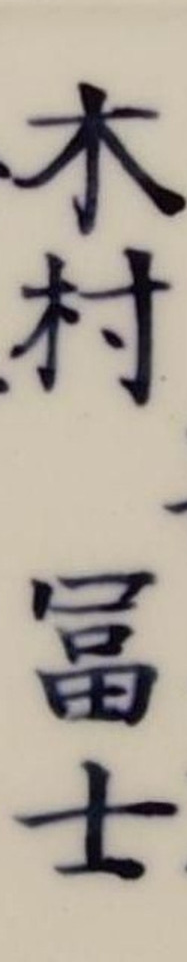木村冨士
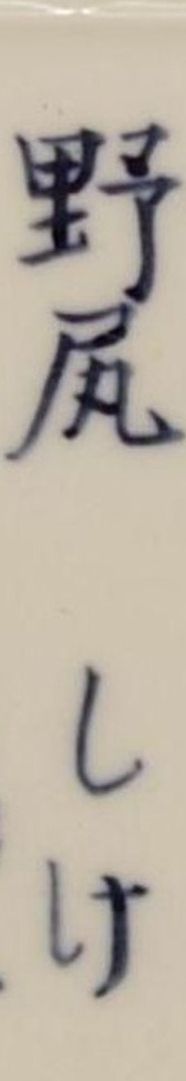野尻しけ
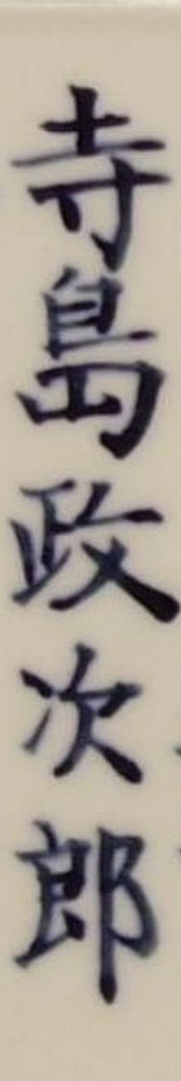寺島政次郎
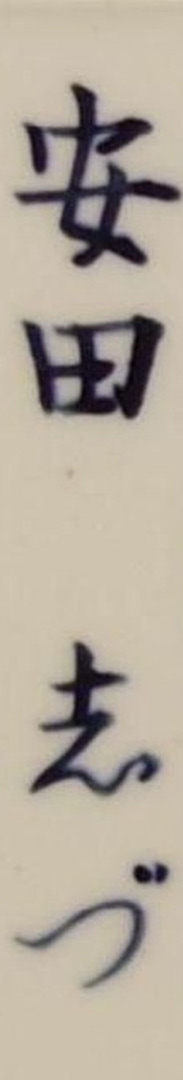安田しづ
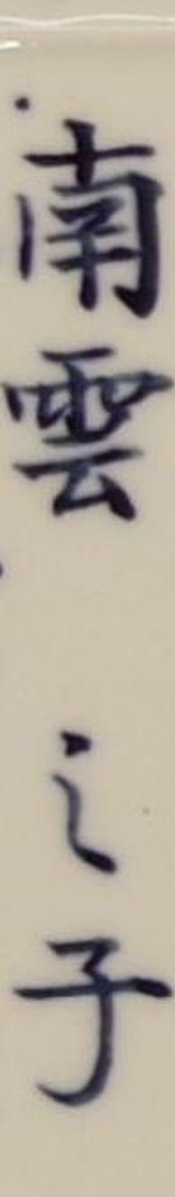南雲ミ子
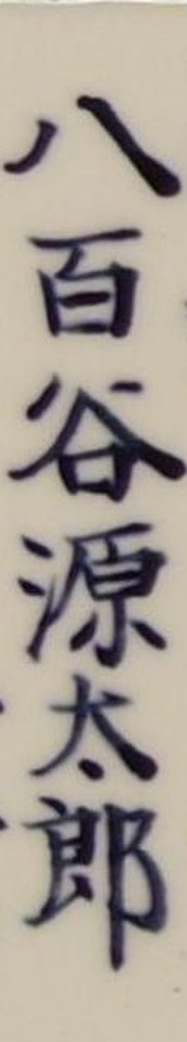八百谷源太郎
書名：E~L
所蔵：高野山金剛峯寺
